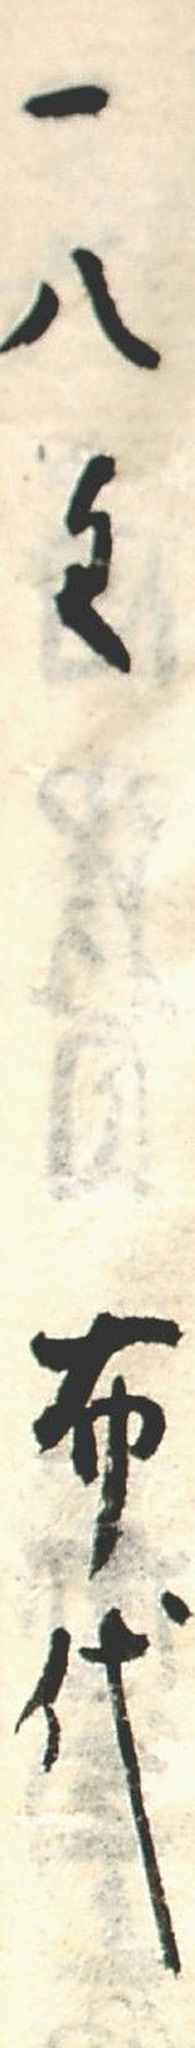一八匁布代
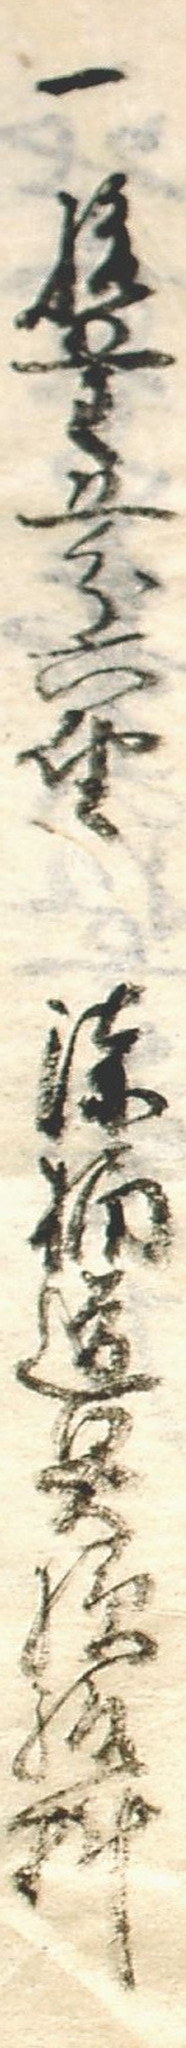一拾五匁五分六厘漆桶道具損給料
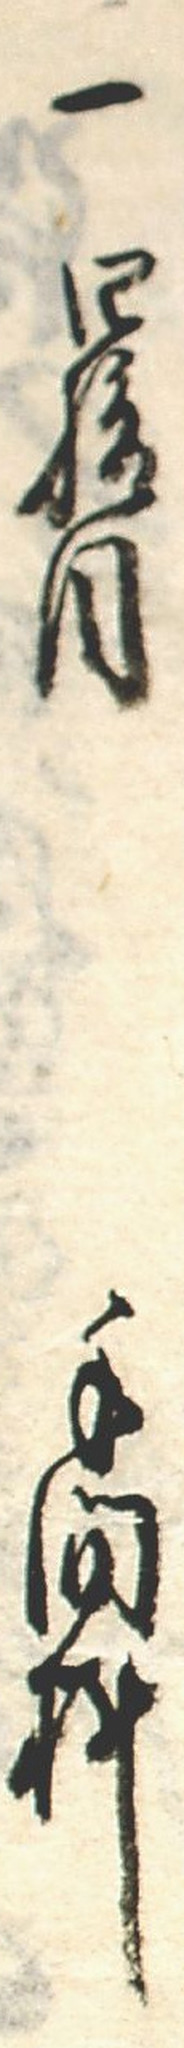一四拾目手間料
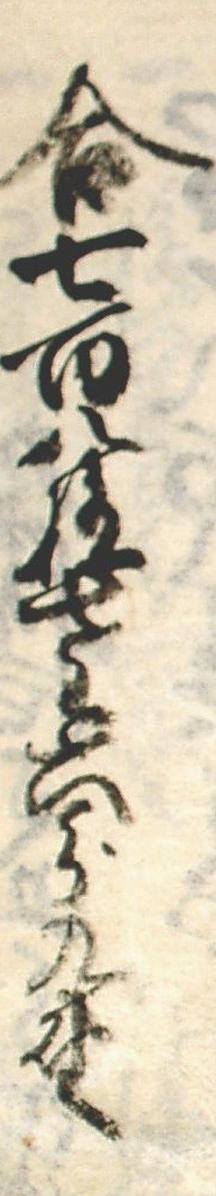合七百八拾七匁六分九厘
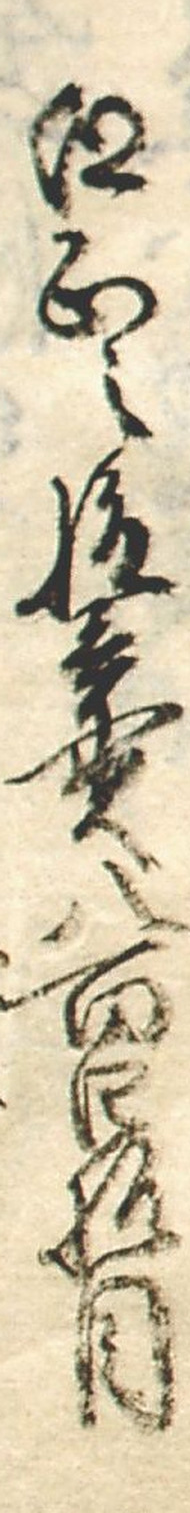但正ミ拾壱貫百四拾目

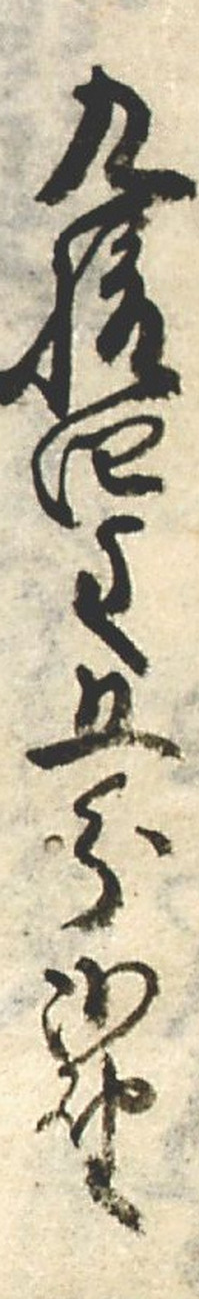九拾四匁五分弐厘
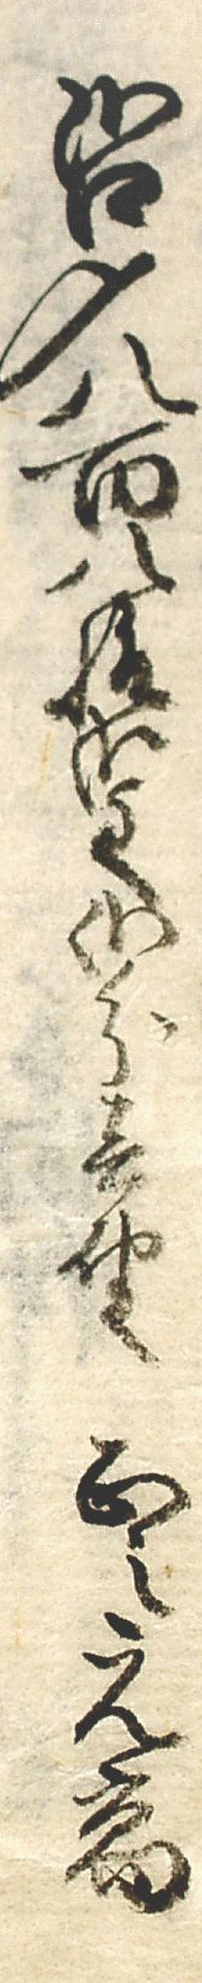弐口〆八百八拾弐匁弐分壱厘正ミ元高
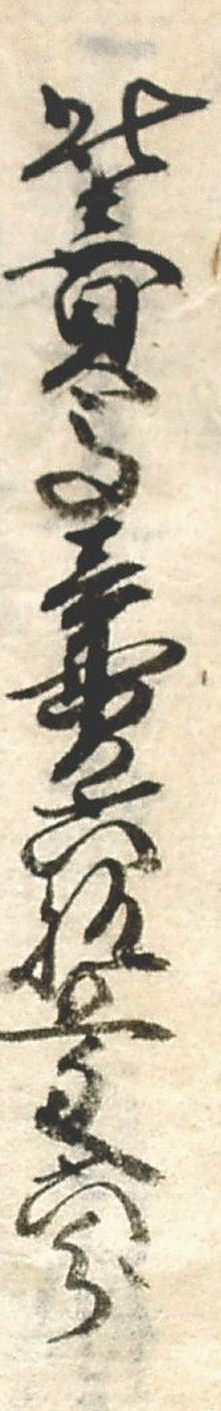此売高壱貫六拾五匁六分
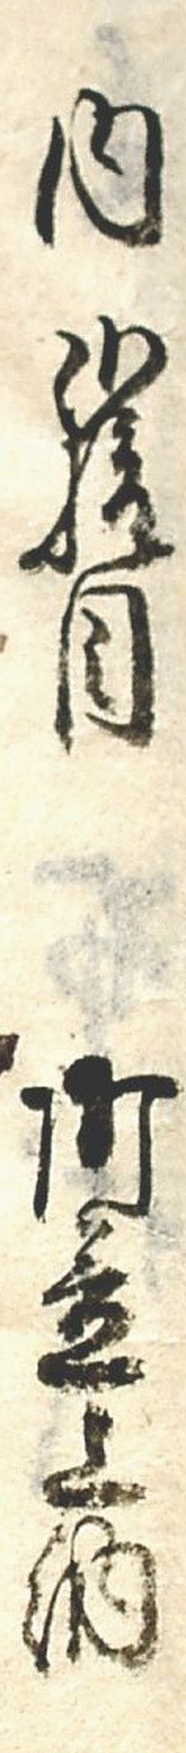内弐拾目御益上納
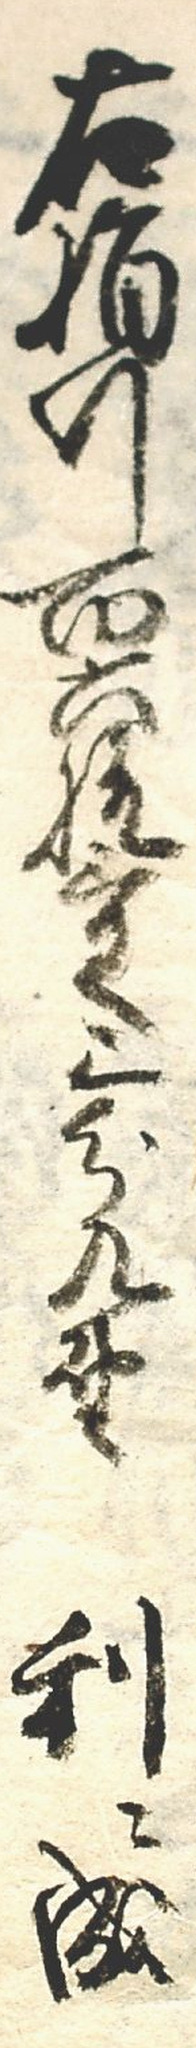右指引百六拾三匁二分九厘利に成
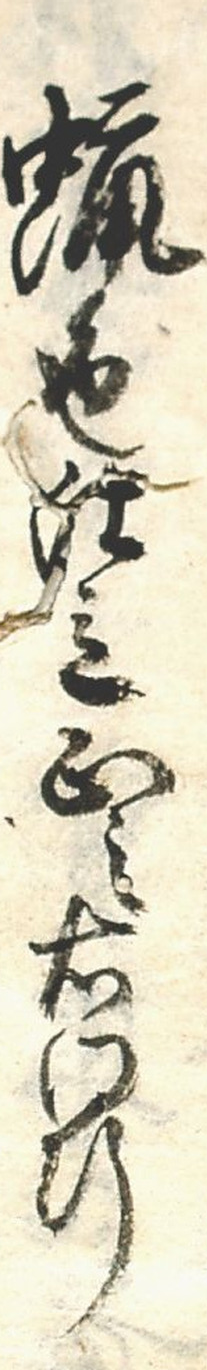蝋色仕立正ミ右同断
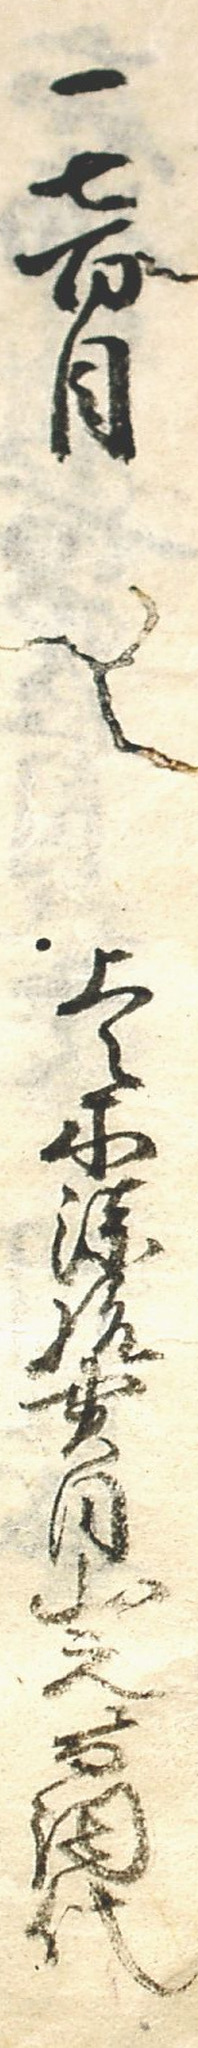一七百目上之木漆拾貫目山元に而調代
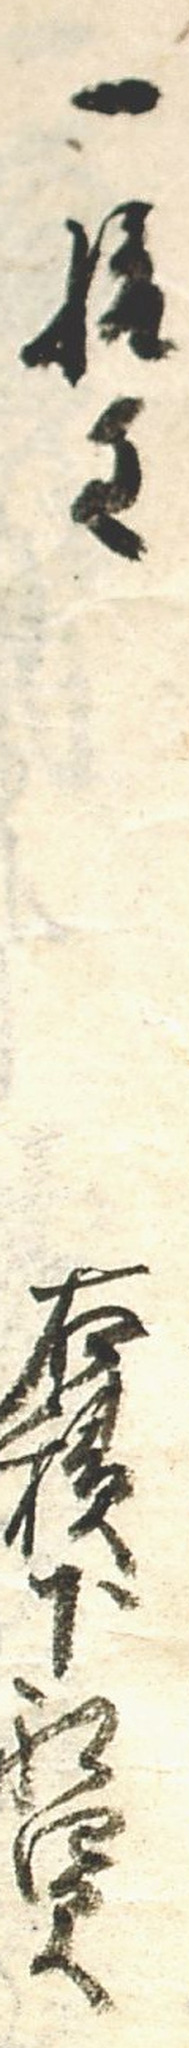一拾匁右積下船賃
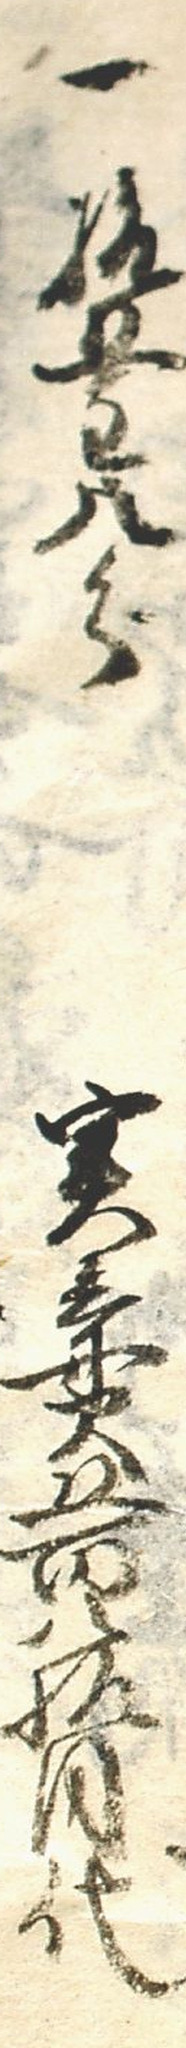一拾五匁八分実壱貫五百八拾目代
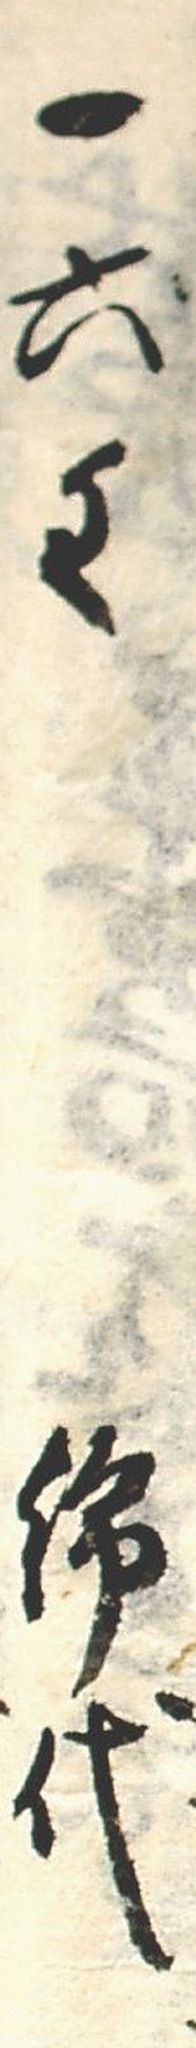一六匁綿代
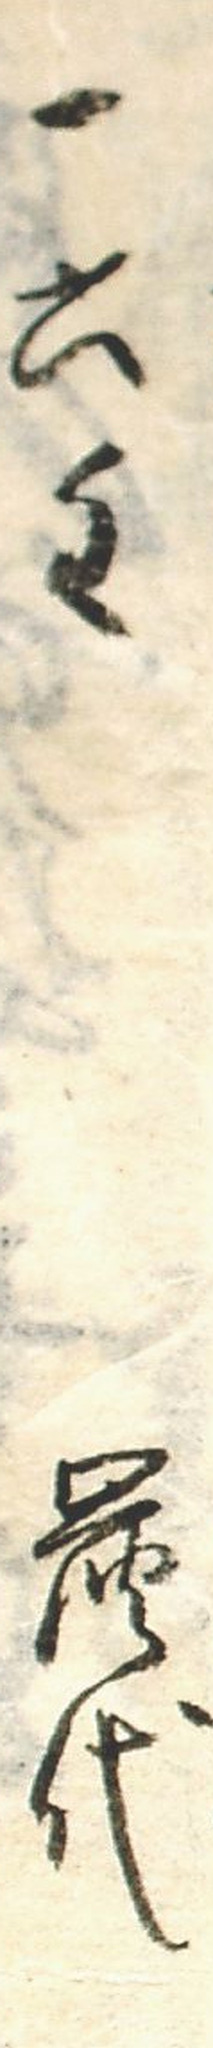一六匁炭代
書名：御国産漆製法越法算建書共取替速判帳
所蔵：鳴門教育大学 Naruto University of Education
